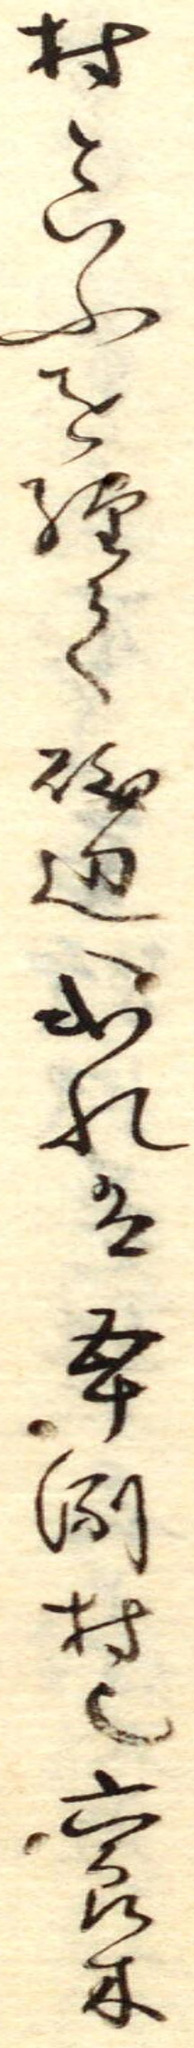村といふを経て礒辺へ出れは五十洲村也六郎木
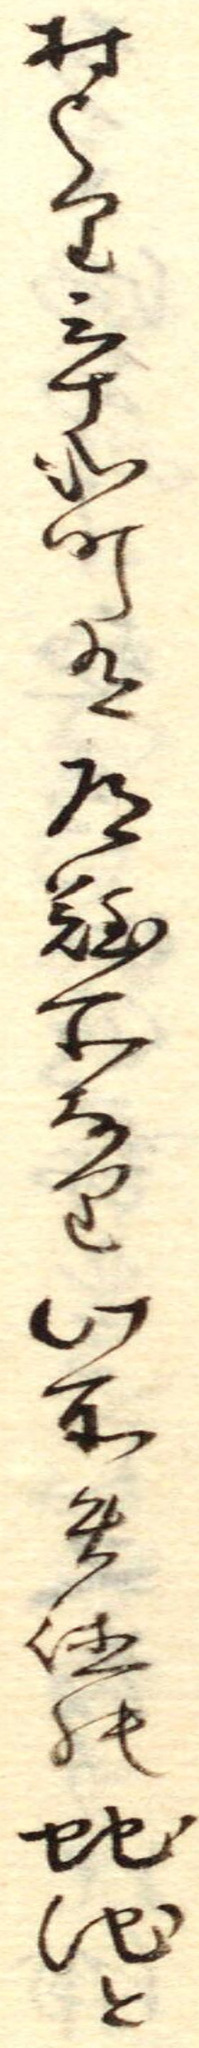村より三十二弐町有道難所なり此所失徳の蛇地と
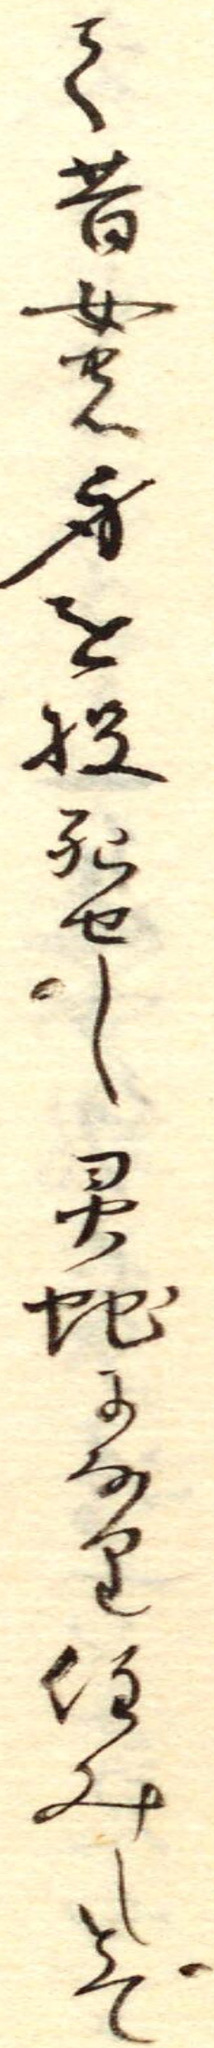て昔女の身を投死せし霊蛇になり住みしとて
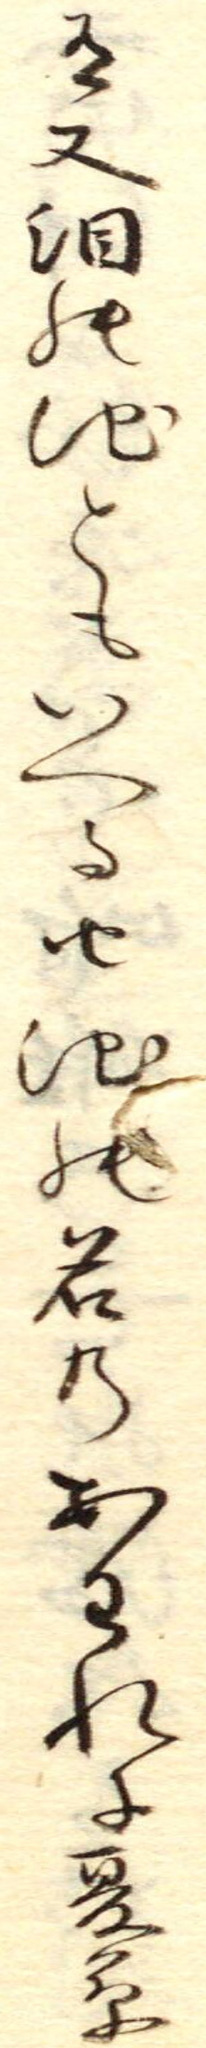有又泪の池ともいへる由池の名あわれに夏草
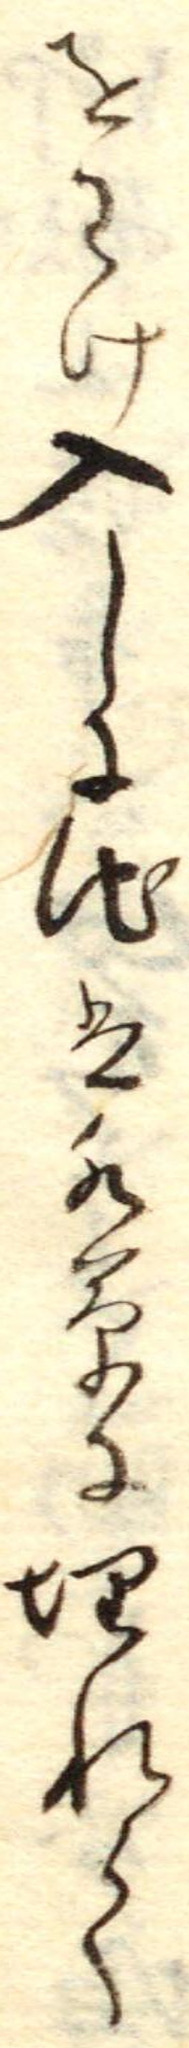をわけ入しに池は水草に埋れて
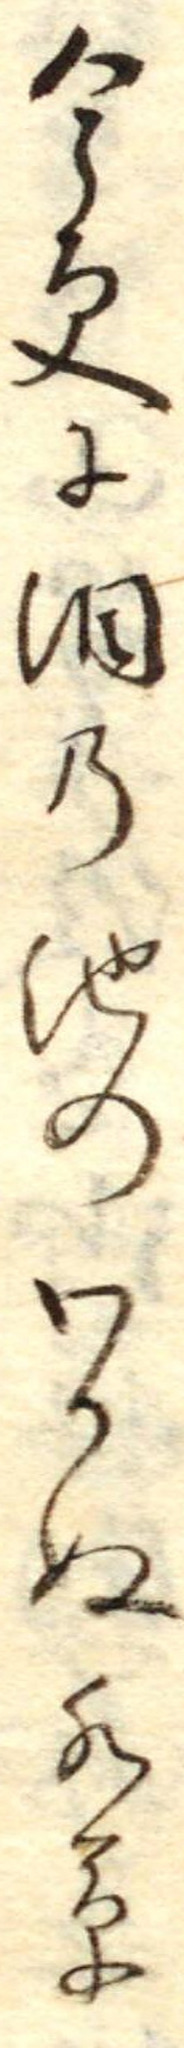今更に泪の池のわかぬ水草
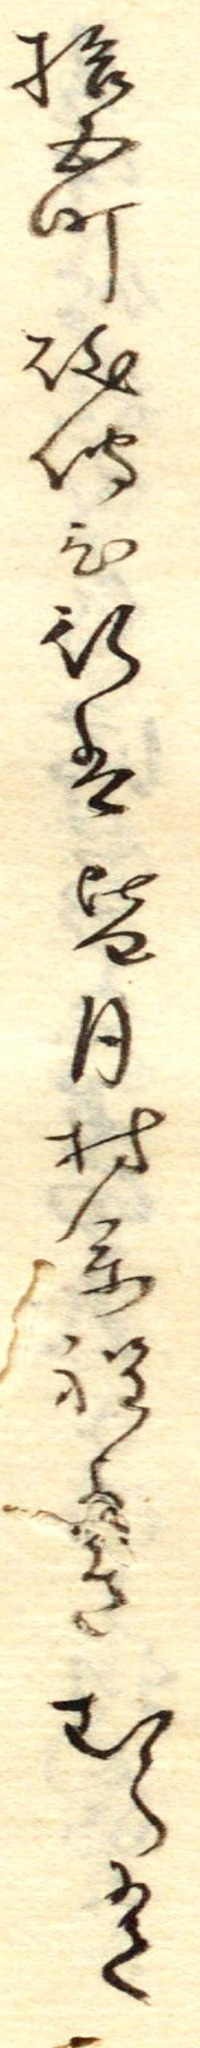拾五町礒伝ひ行は皆月村余程よきむらにて

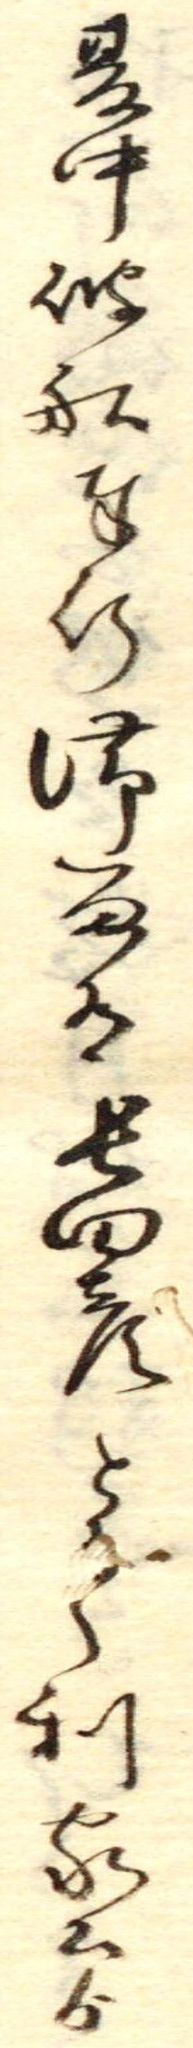夏中破船奉行滞留有長田彦とて利家公ゟ
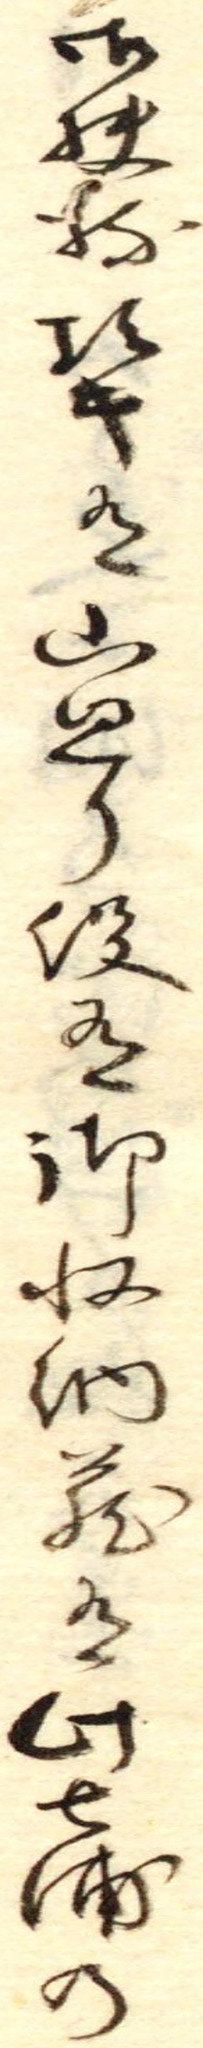御扶持頂き有山廻り役有御収納蔵有此七浦の
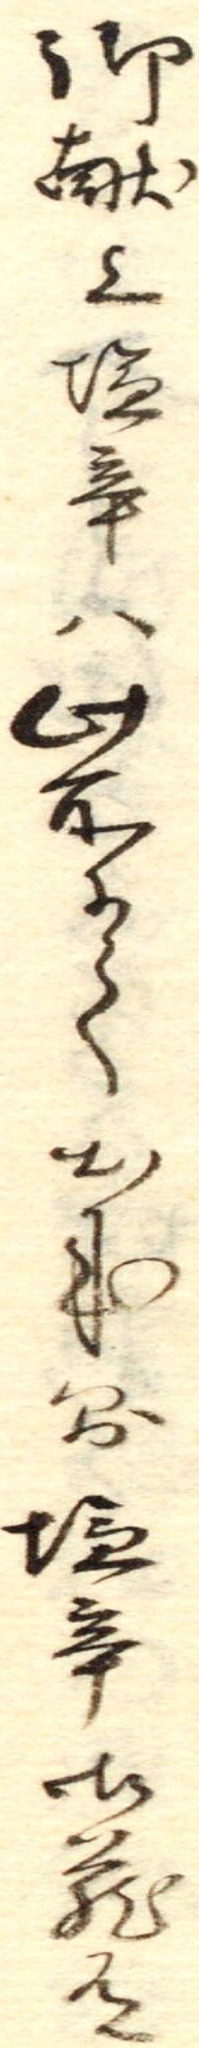御献上塩辛は此所にて出来則塩辛御蔵有
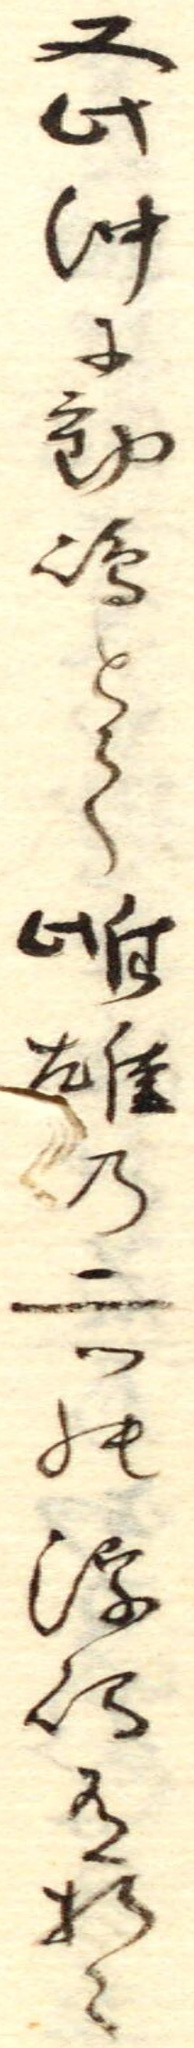又此沖に動嶋とて雌雄の二ッの浮嶋有折々
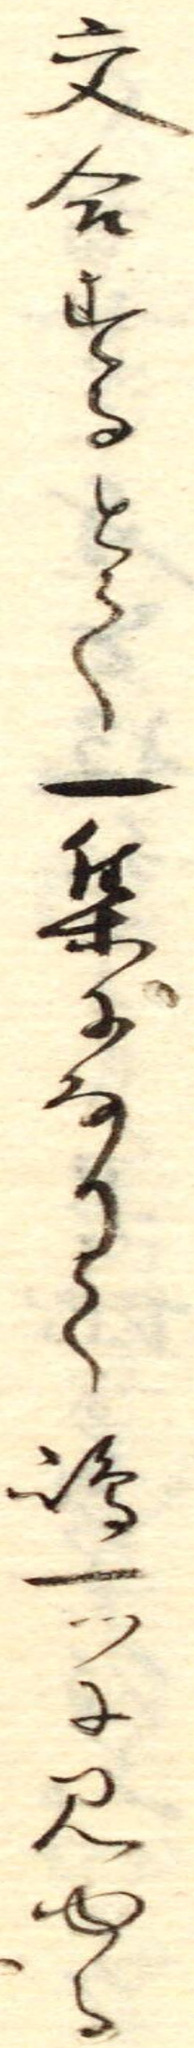交合するとて一集になりて嶋一ツに見ゆる
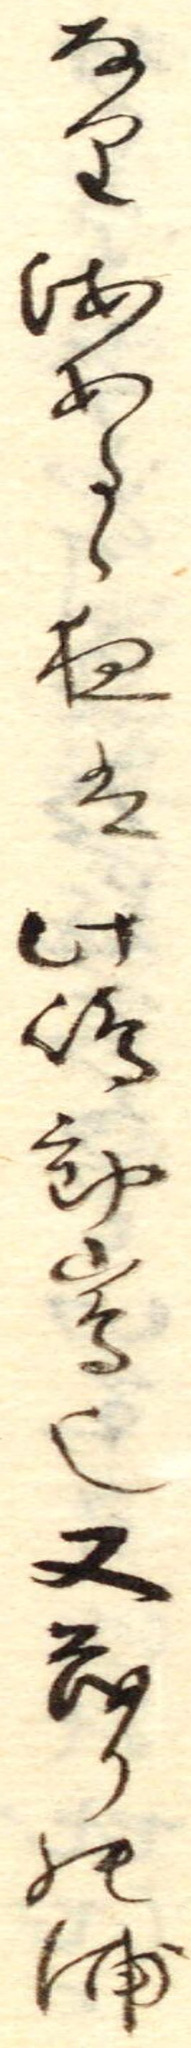なり海あるゝ夜は此嶋動嶌也又茂りの浦
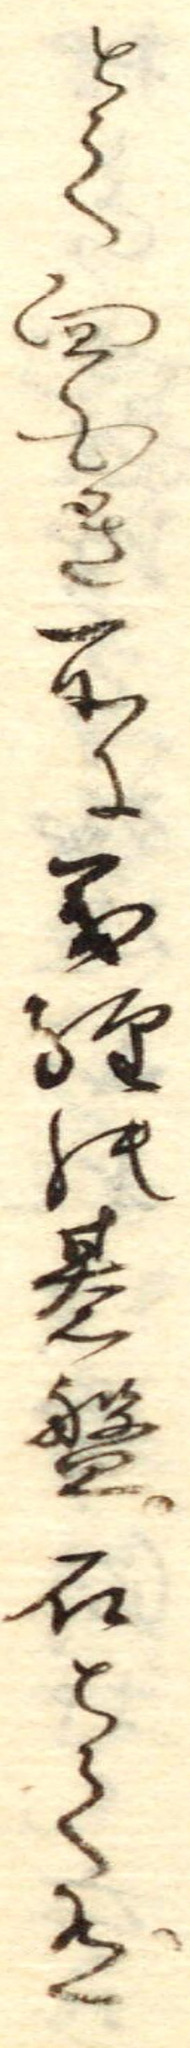とて面白き所に義経の基盤石とて有
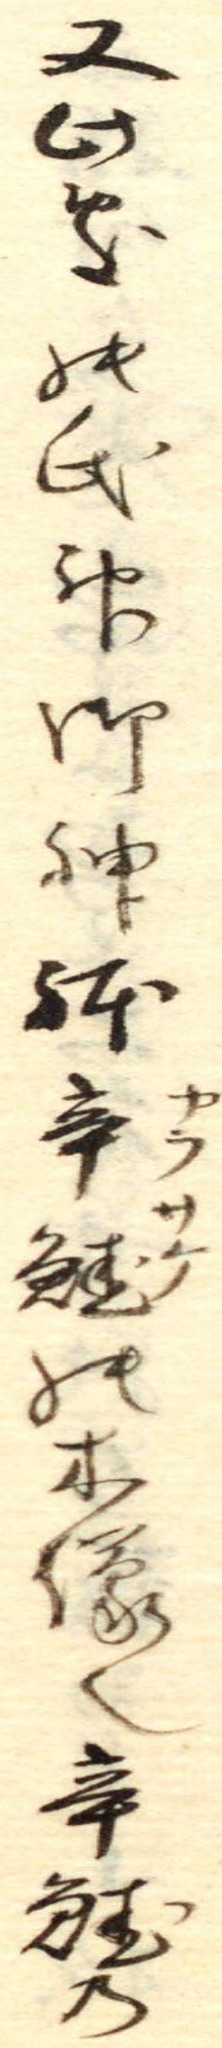又此処の氏神御神躰辛鮭の木像也辛鮭の
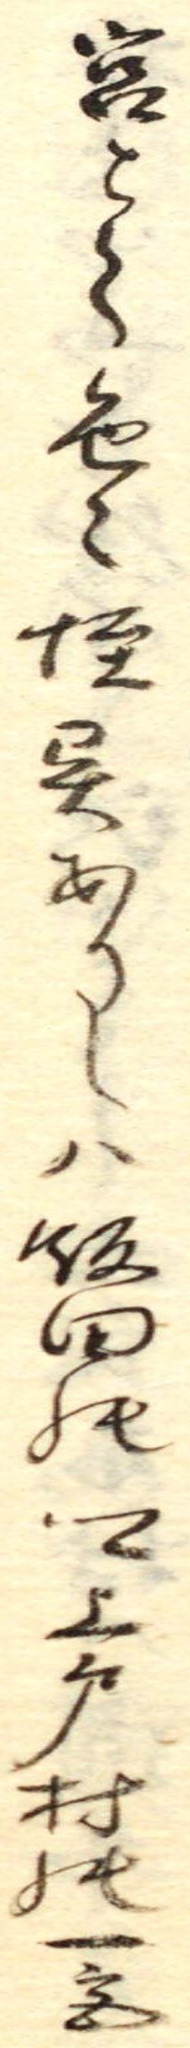宮とて色々怪異ありしは飯田の郷上戸村の一宮
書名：能登名跡誌
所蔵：Ishikawa Prefectural Library
